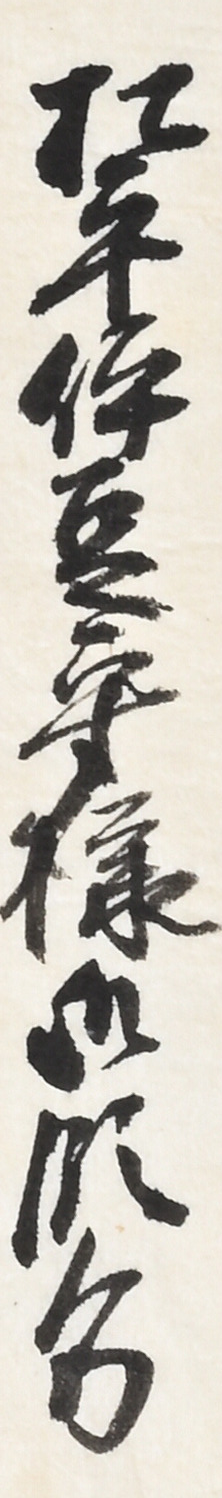松平伊豆守様御領分
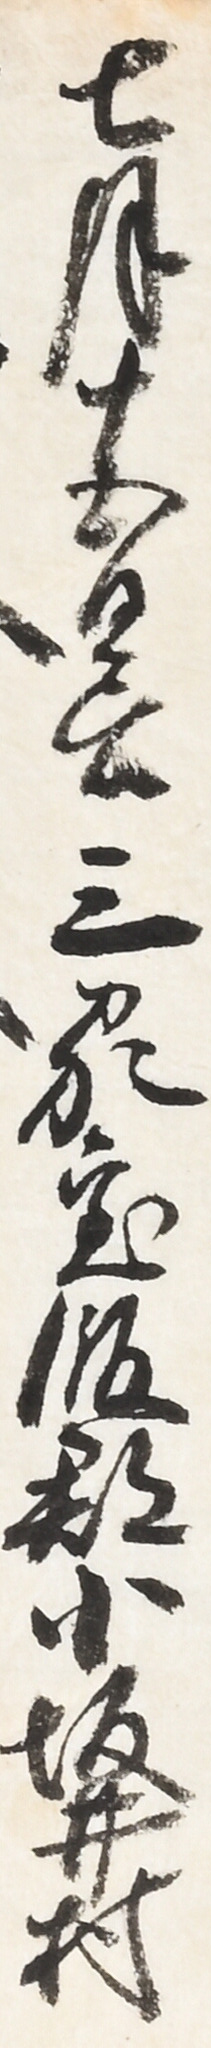七月十五日着三州宝飯郡小坂井村
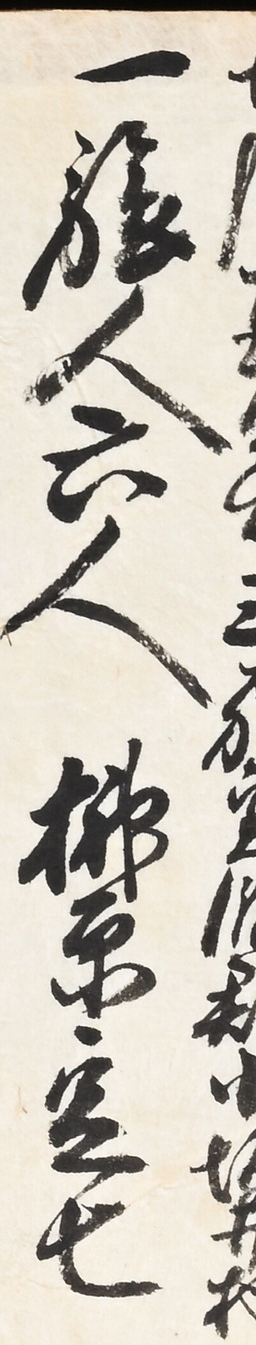一旅人六人榊原定七
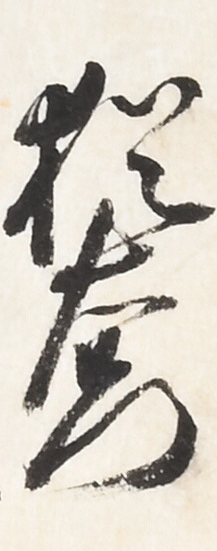猶右衛門
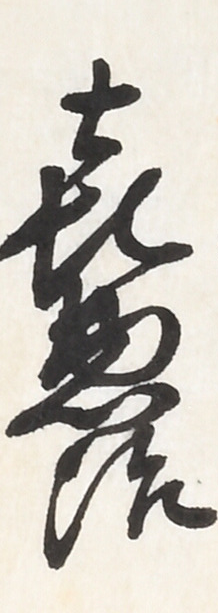喜惣治
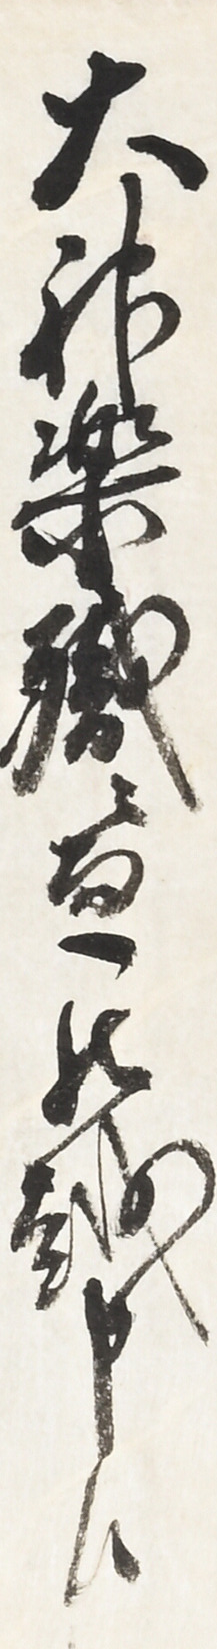大神楽職ニ而罷越申候
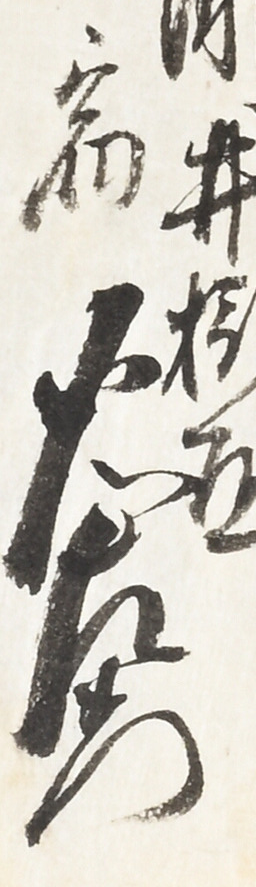宿忠左衛門
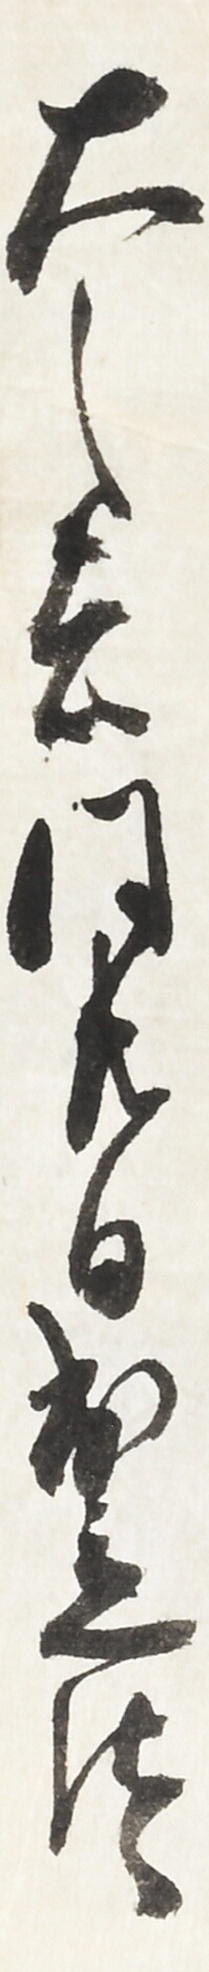右之者同廿日出立仕候
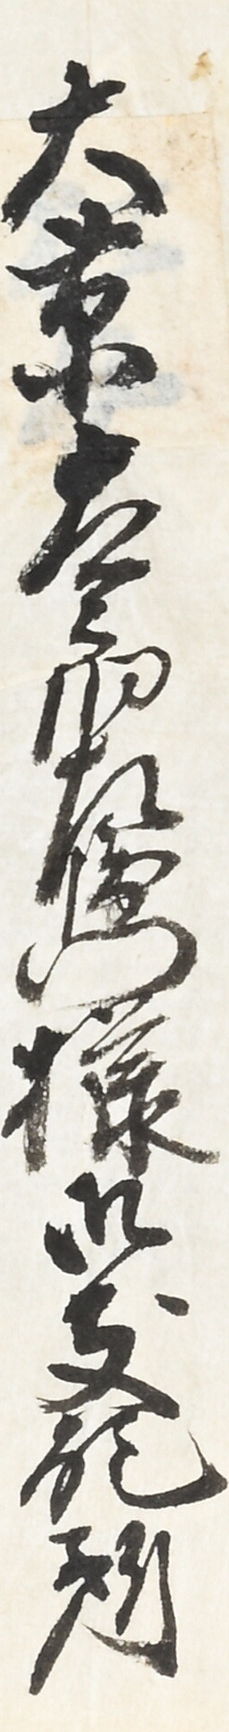大京太郎左衛門様御支配所
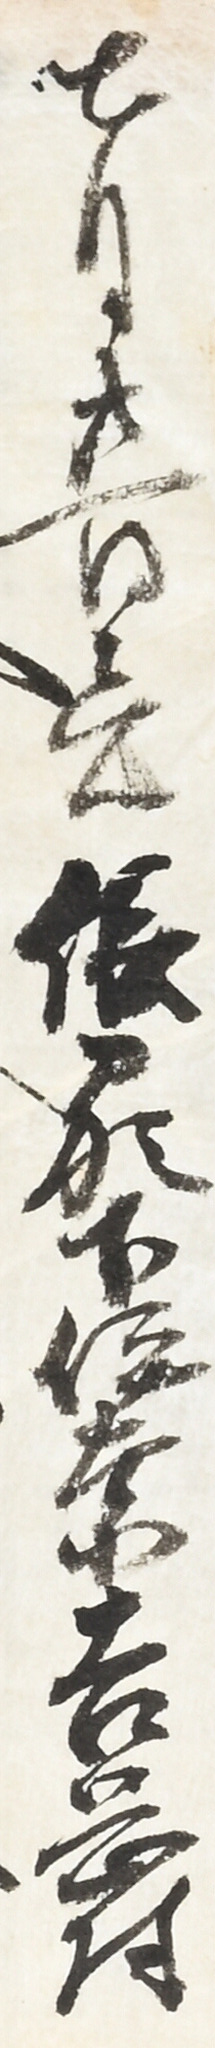七月廿一日着信州下伊奈吉岡村
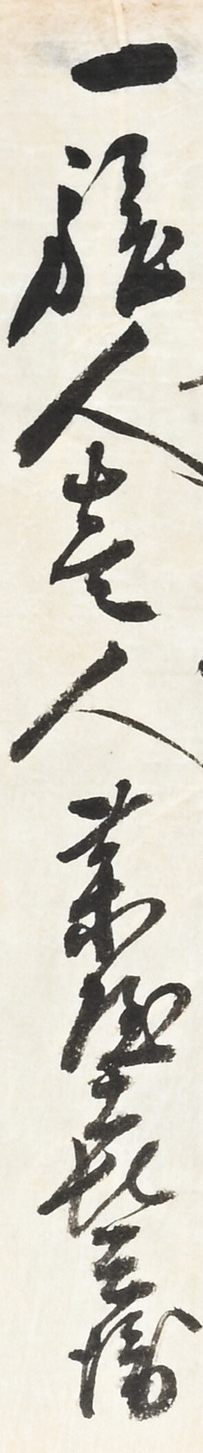一旅人壱人薬屋喜兵衛
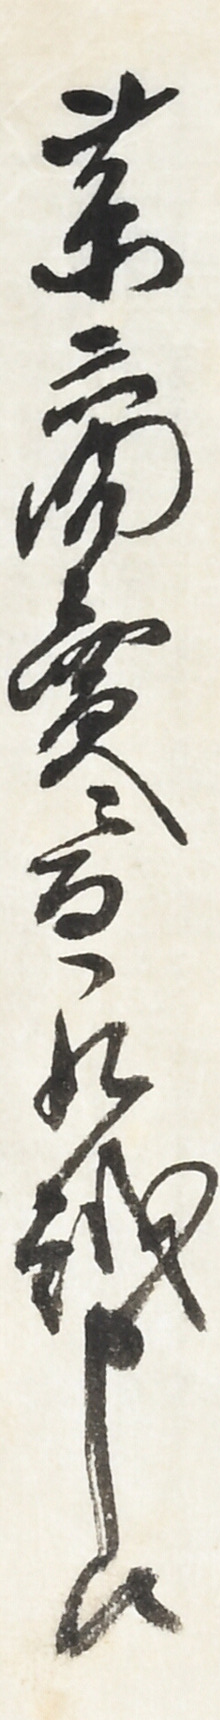薬商売ニ而罷越申候
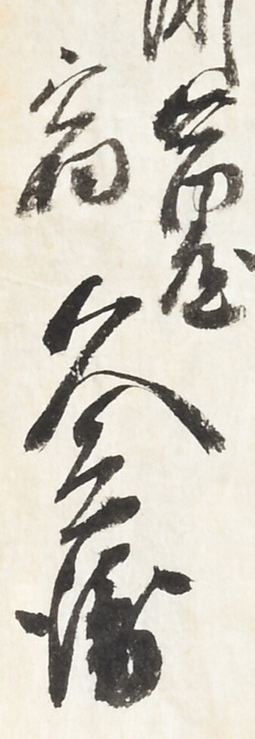宿久兵衛

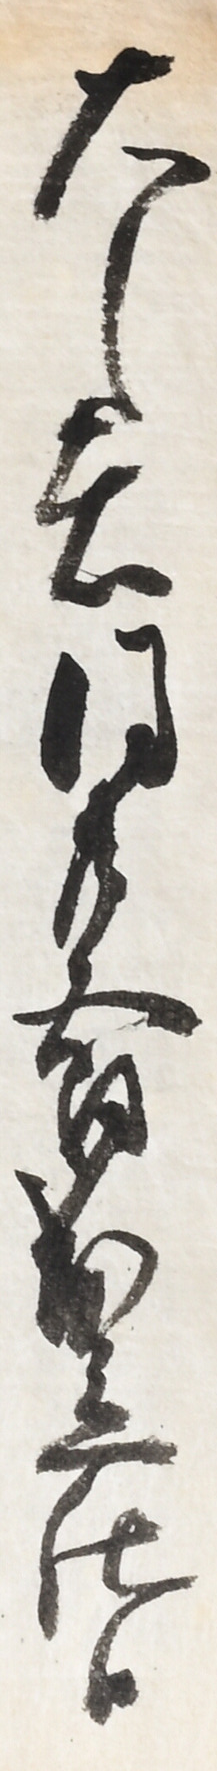右之者同廿五日出立仕候
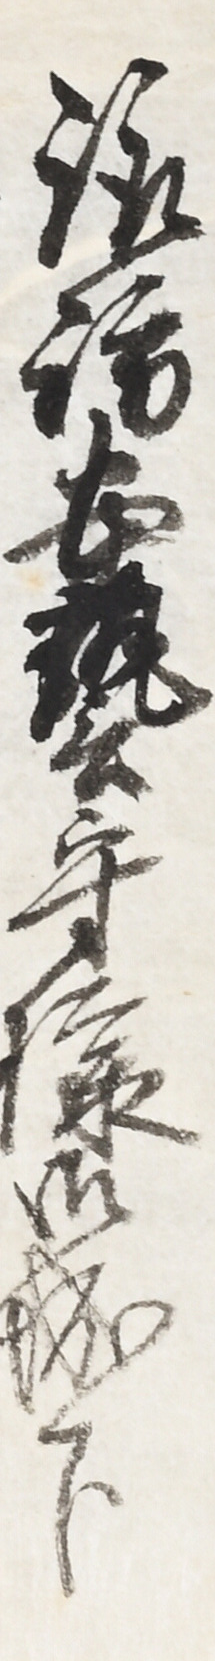諏訪安芸守様御城下
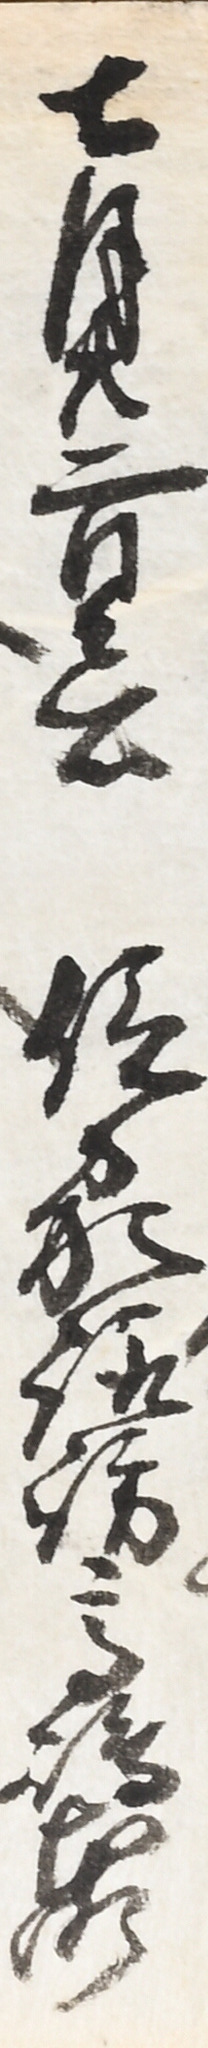七月廿二日着信州諏訪高嶋本町
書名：旅人泊控帳
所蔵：伊那市立高遠町図書館・合同会社AMANE
